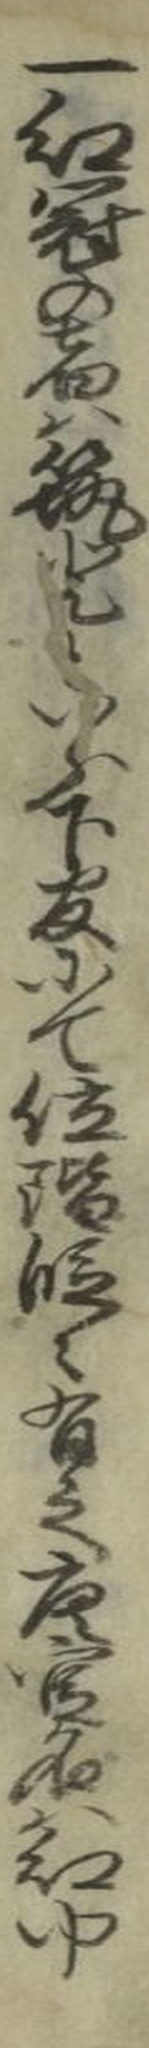一紅冠の者は筑登といふ下官にて位階段々有之唐官名は紅巾
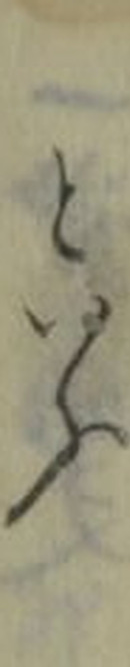といふ
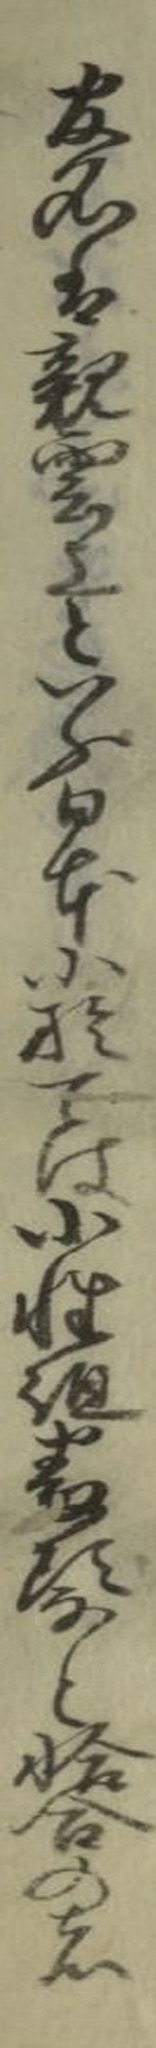官名は親雲上といふ日本に於ては小姓組番頭なと恰合の者

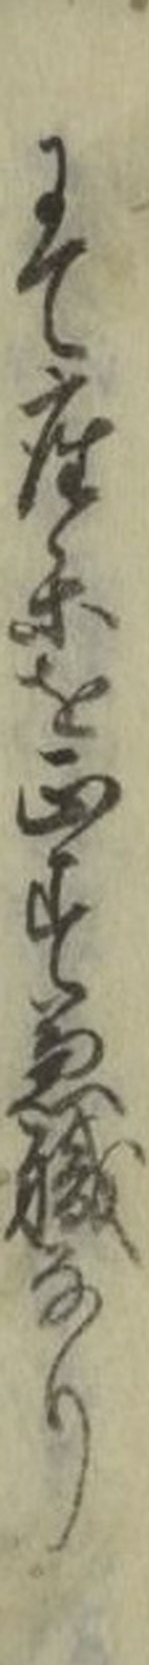にて座楽を正す兼職なり
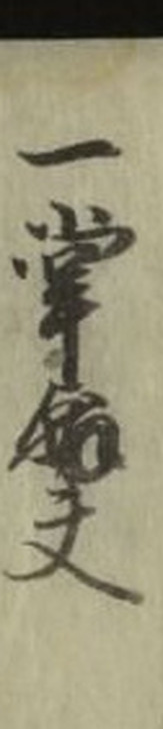一掌翰夫
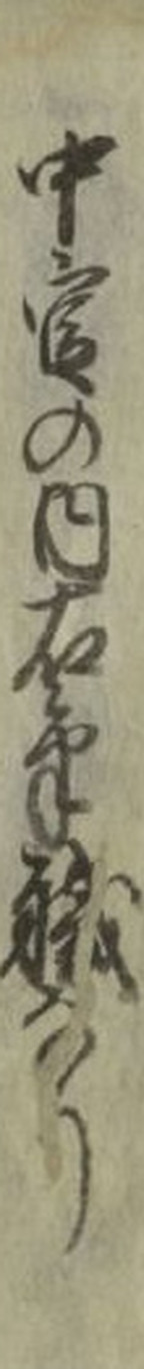中官の内右束職なり
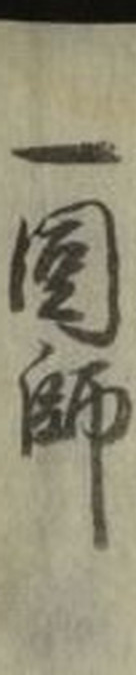一図師
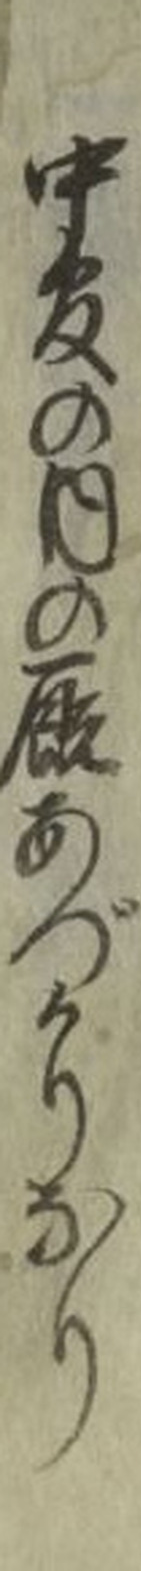中官の内の厩あづかりなり
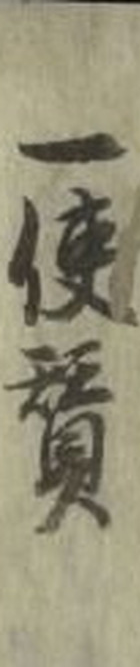一使賛
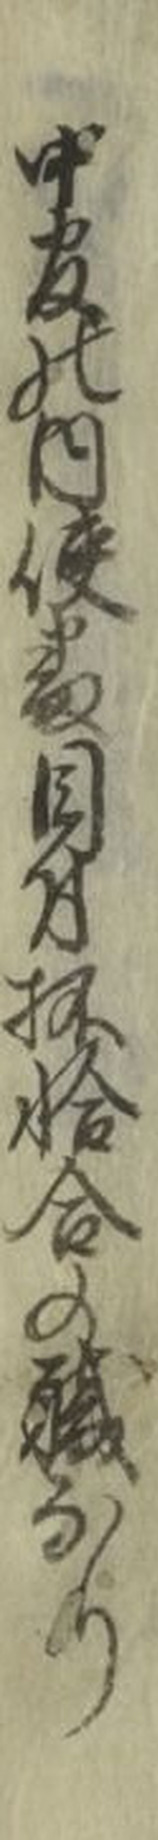中官の内使番目付抔恰合の職なり
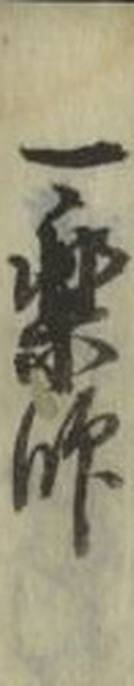一楽師
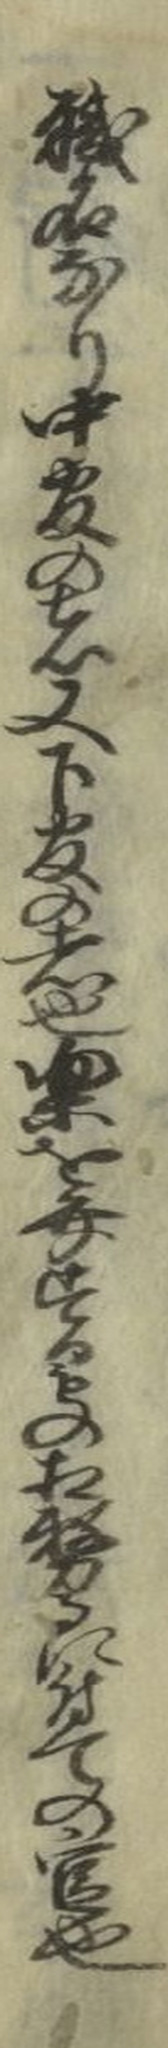職名なり中官の者又下官の者也楽を弁するもの相努るに付ての官也
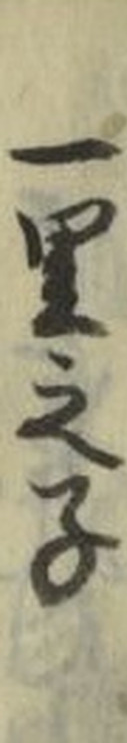一里之子
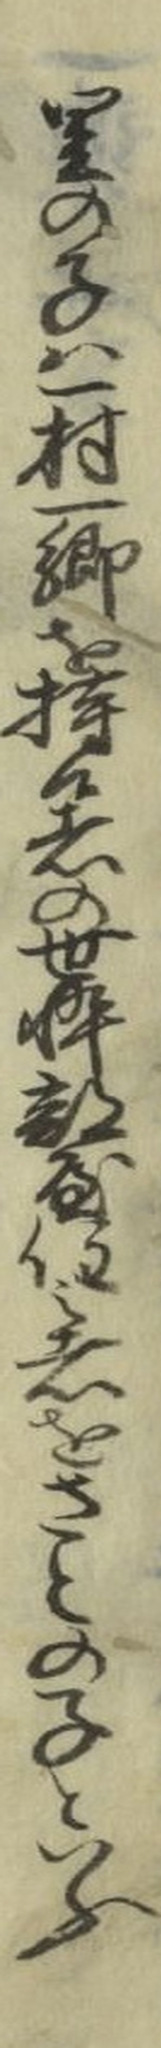里の子は一村一郷を持候者の世忰部屋住之者をさとの子といふ
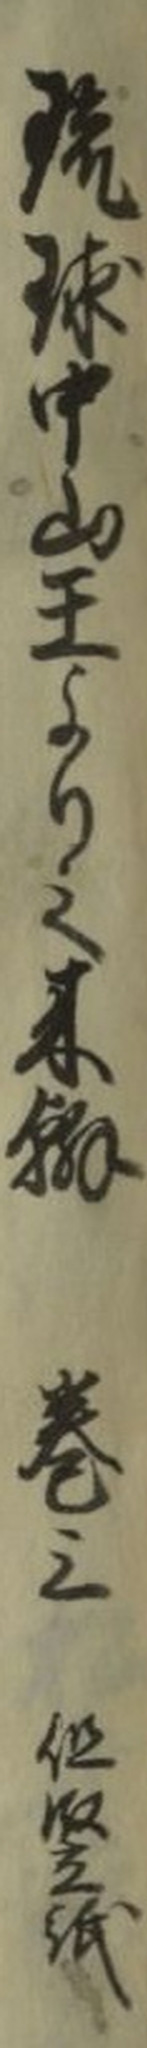琉球中山王より之来翰巻三但堅紙
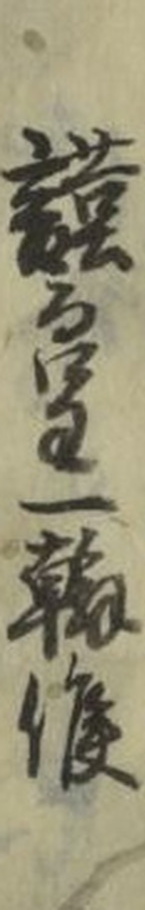謹而呈一翰候
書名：琉球人来朝之記
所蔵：University of the Ryukyus Library
